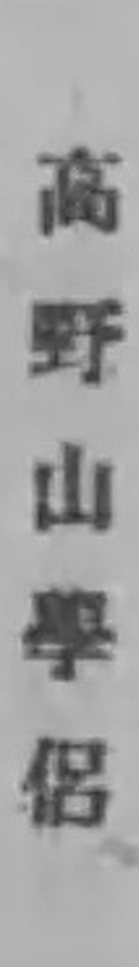高野山学侶
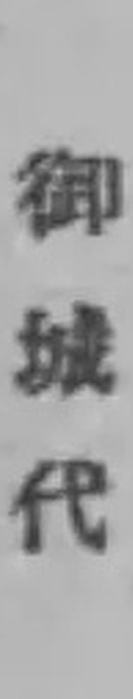御城代
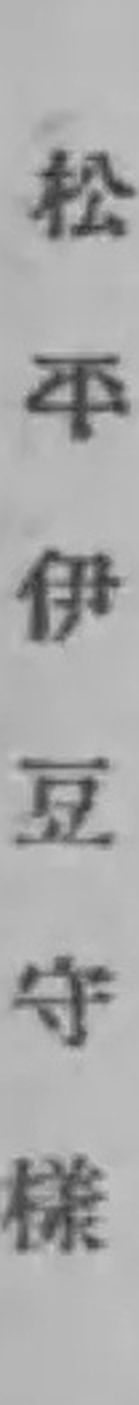松平伊豆守様
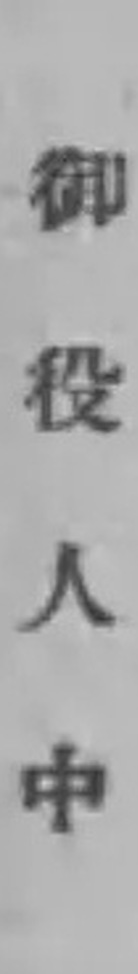御役人中
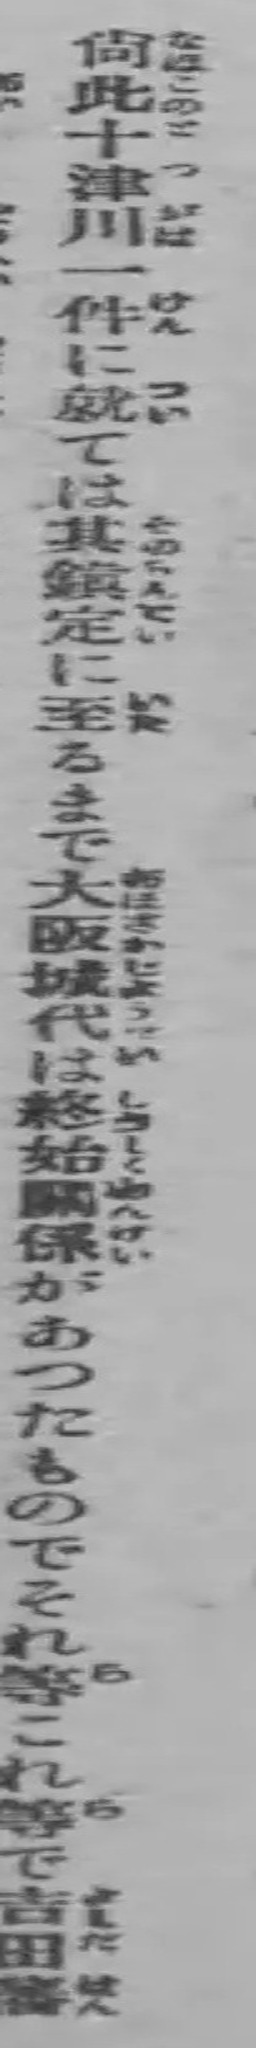尚此十津川一件に就ては其鎮定に至るまで大阪城代は終始関係があつたものでそれ等これ等で吉田藩
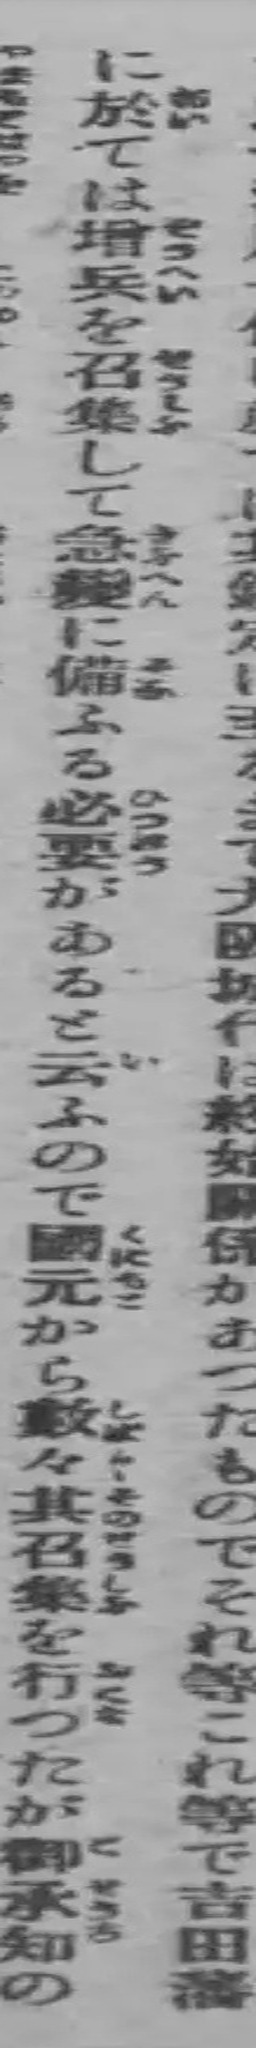に於ては増兵を召集して急変に備ふる必要があると云ふので国元から数々其召集を行つたが御承知の
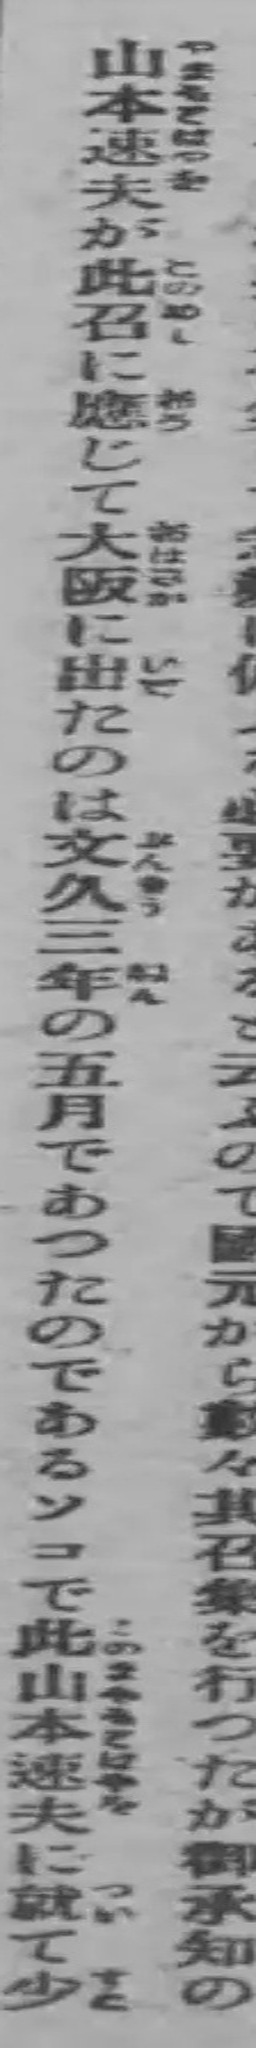山本速夫山本速夫が此召に応じて大阪に出たのは文久三年の五月であつたのであるソコで此山本速夫に就て少
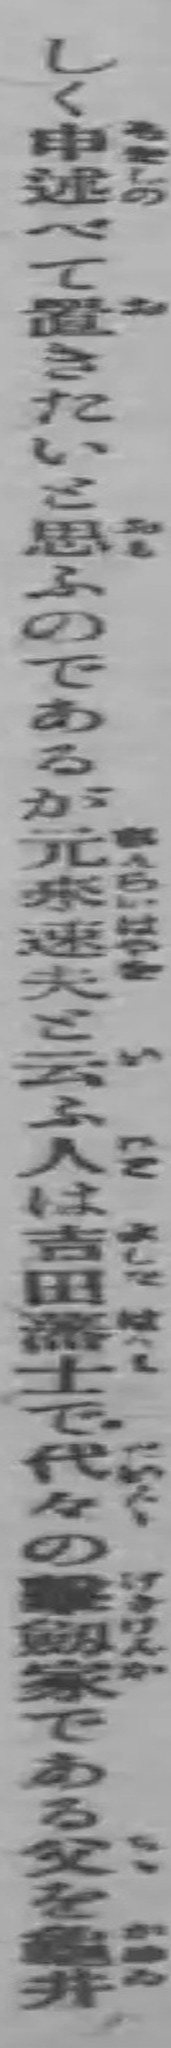しく申述べて置きたいと思ふのであるが元来速夫と云ふ人は吉田藩士で代々の撃釼家である父を亀井
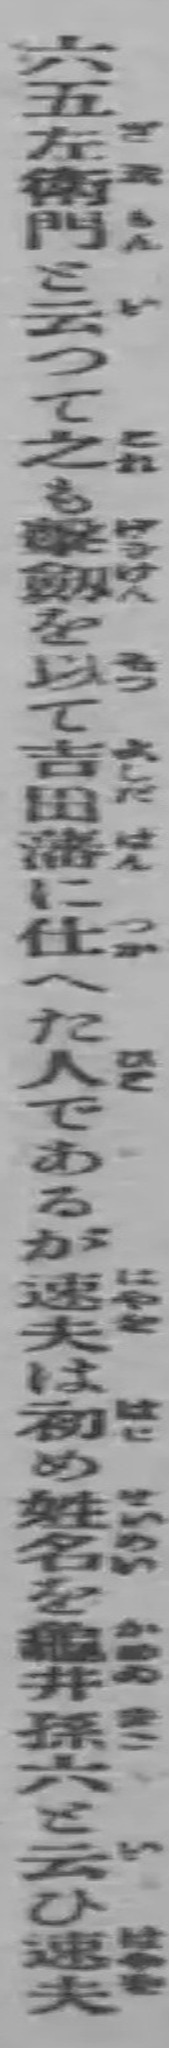六五左衛門と云つて之も撃釼を以て吉田藩に仕へた人であるが速夫は初め姓名を亀井孫六と云ひ速夫
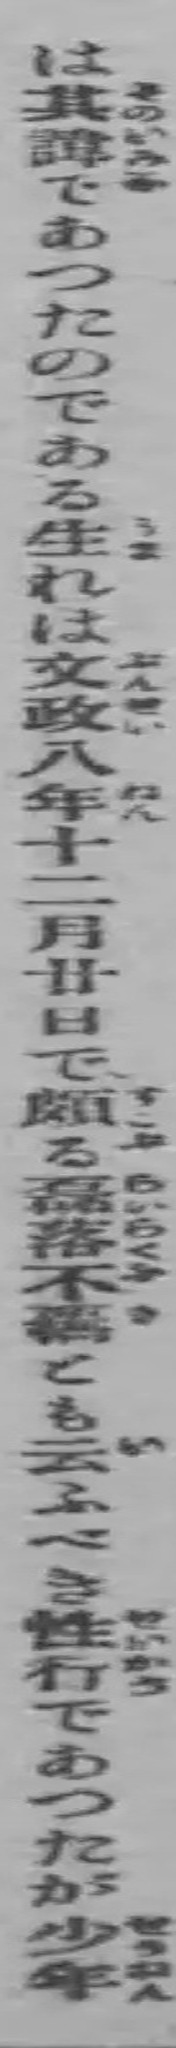は其諱であつたのである生れは文政八年十二月廿日で頗る磊落不羈とも云ふべき性行であつたが少年
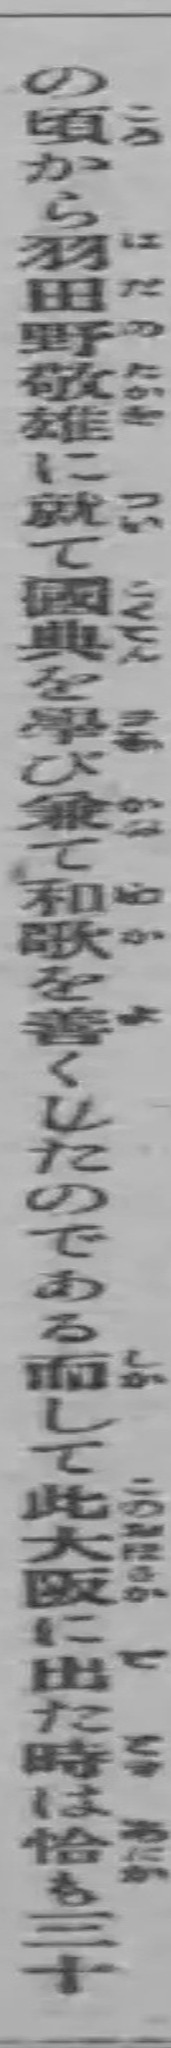の頃から羽田野敬雄に就て国典を学び兼て和歌を善くしたのである而して此大阪に出た時は恰も三十
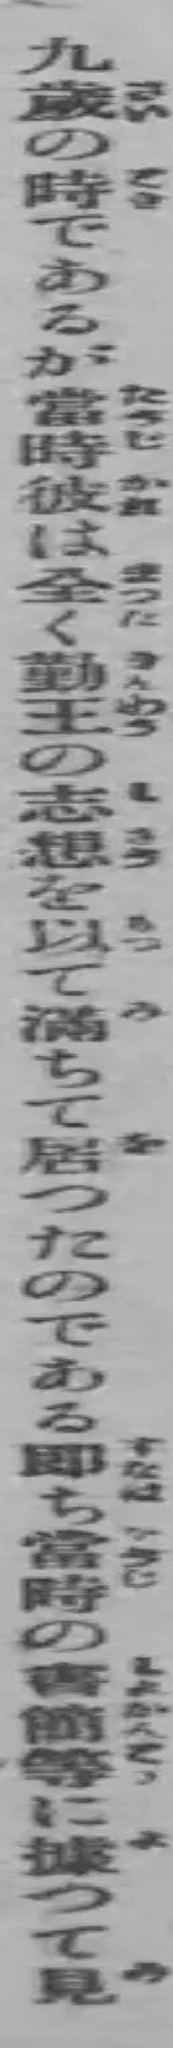九歳の時であるが当時彼は全く勤王の志想を以て満ちて居つたのである即ち当時の書簡等に拠つて見
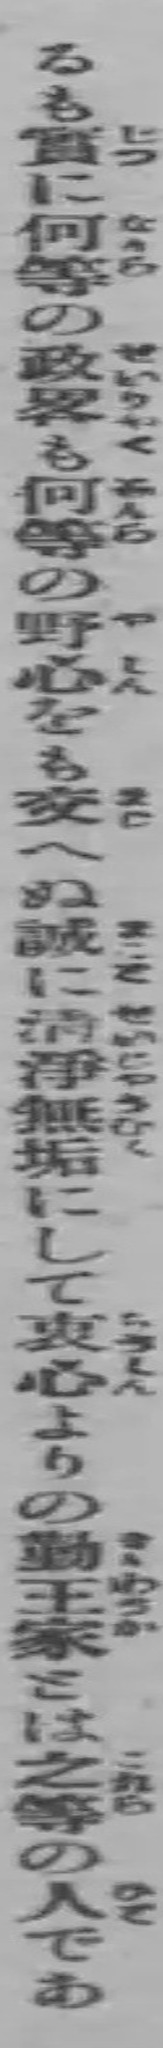るも実に何等の政略も何等の野心をも交へぬ誠に清浄無垢にして衷心よりの勤王家とは之等の人であ
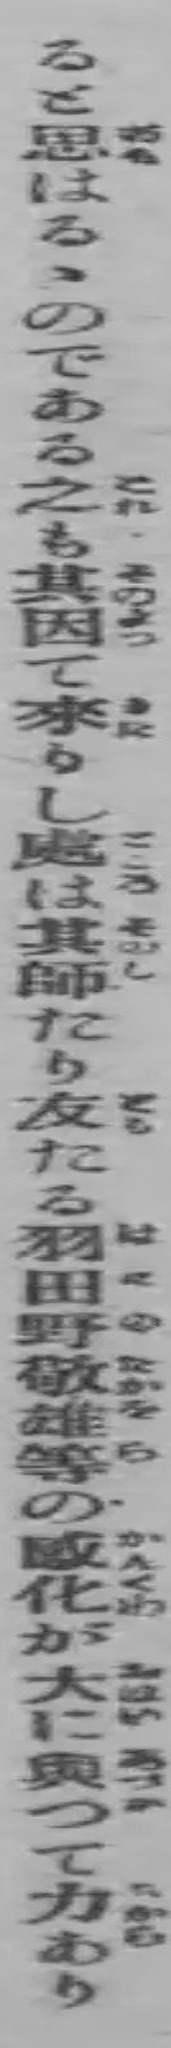ると思はるゝのである之も其因て来りし処は其師たり友たる羽田野敬雄等の感化が大に与つて力あり
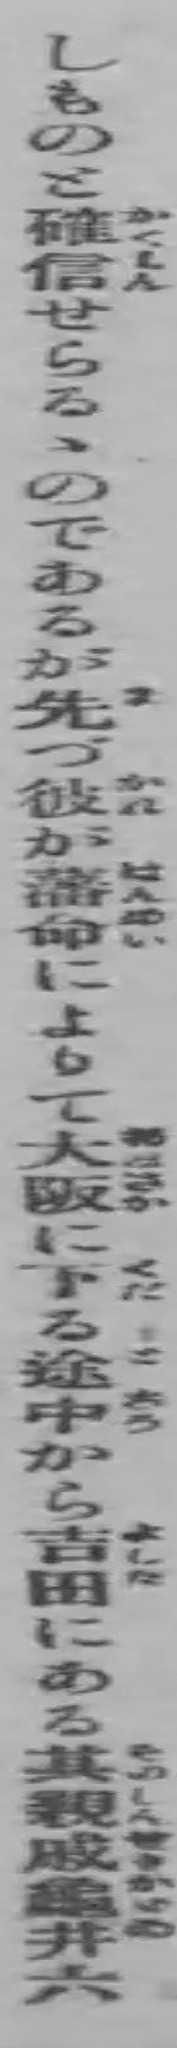しものと確信せらるゝのであるが先づ彼が藩命によりて大阪に下る途中から吉田にある其親戚亀井六
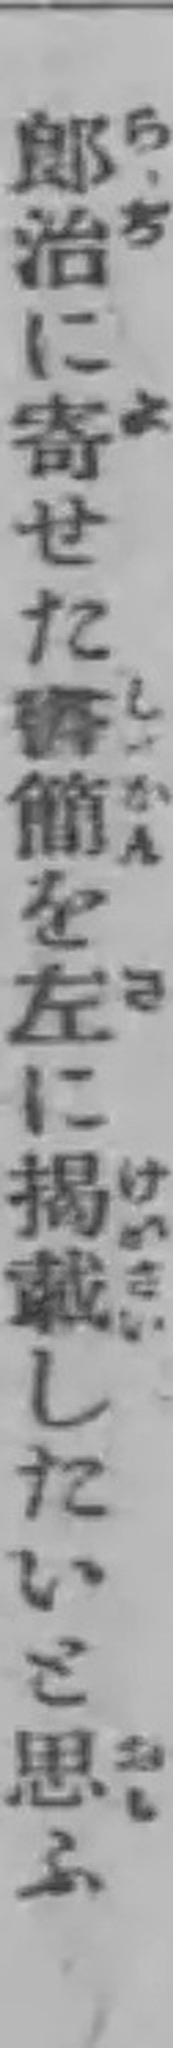郎治に寄せた書簡を左に掲載したいと思ふ
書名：豊橋市史談
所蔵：国立国会図書館 National Diet Library, JAPAN
